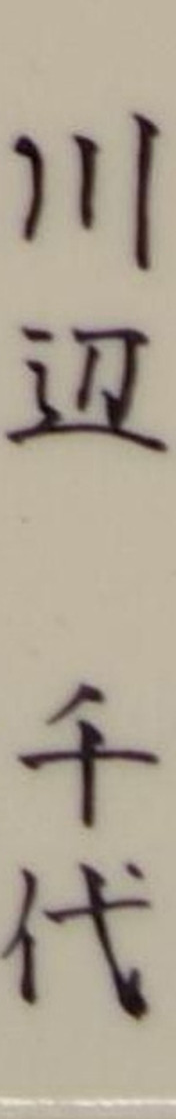川辺千代
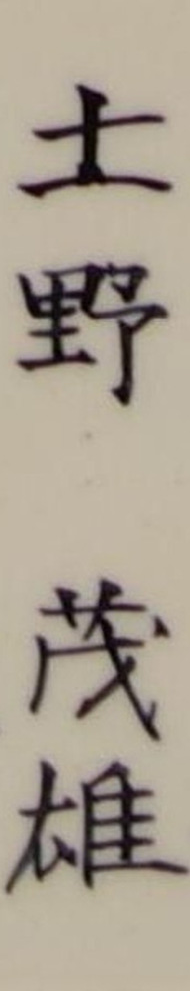土野茂雄
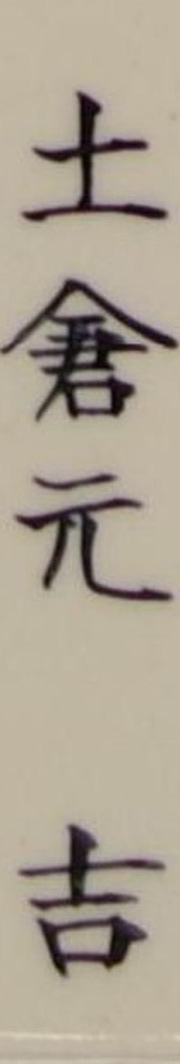土倉元吉
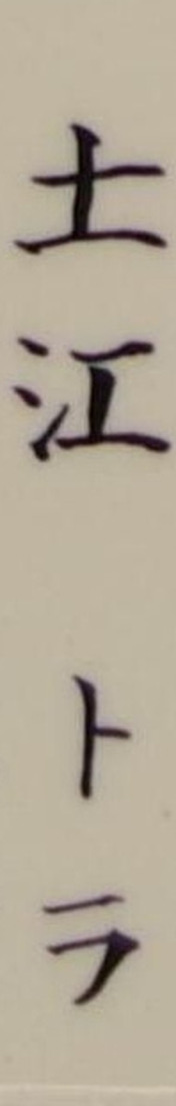土江トラ
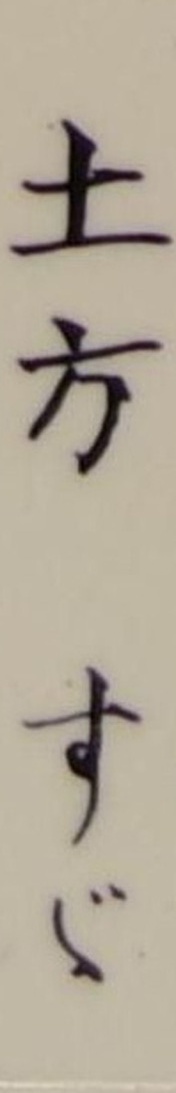土方すず
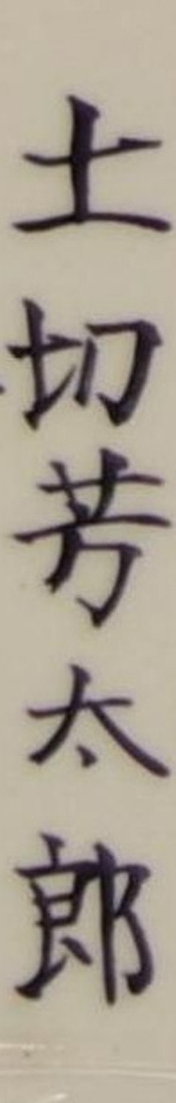土切芳太郎
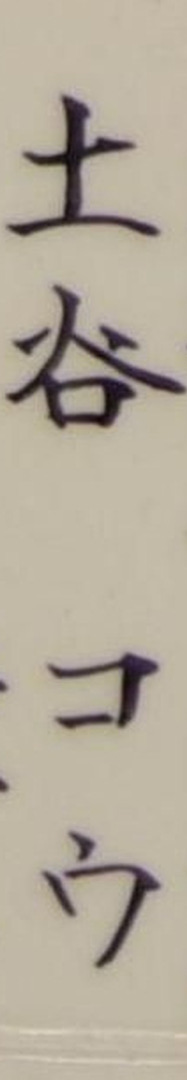土谷コウ

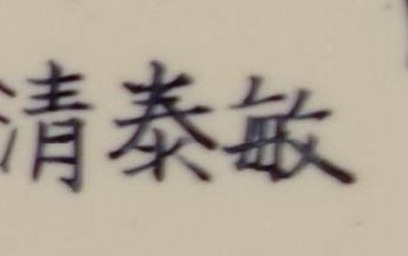清水敏
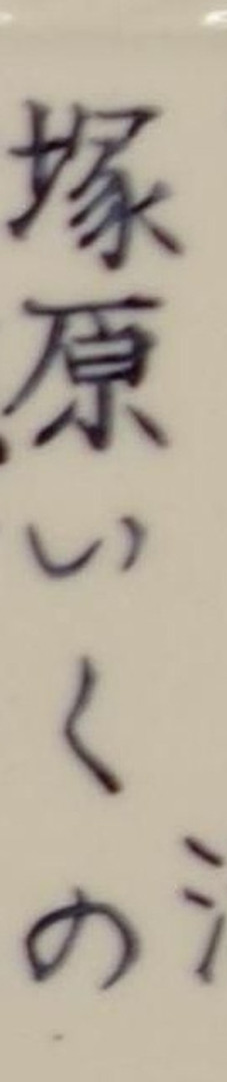塚原いくの
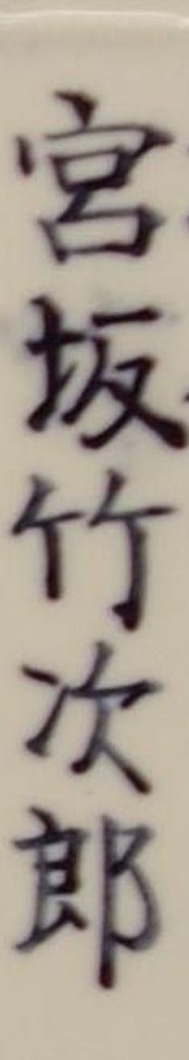宮坂竹次郎
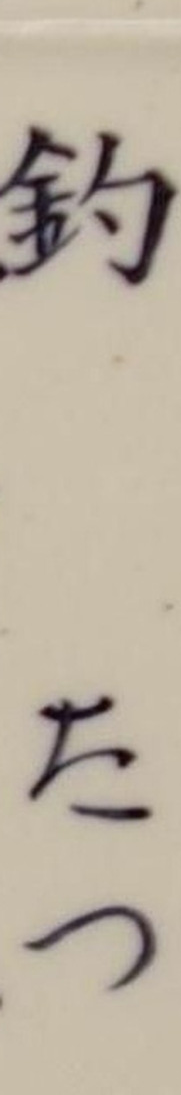釣たつ
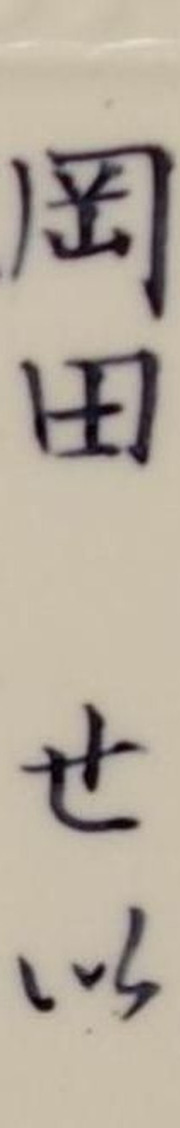岡田せい
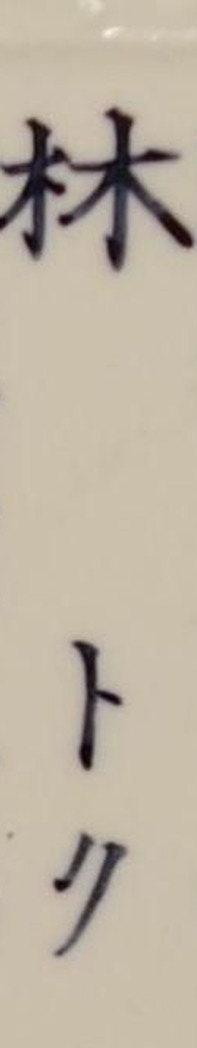林トク
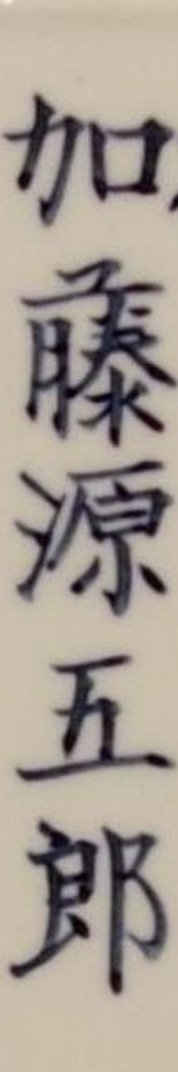加藤源五郎
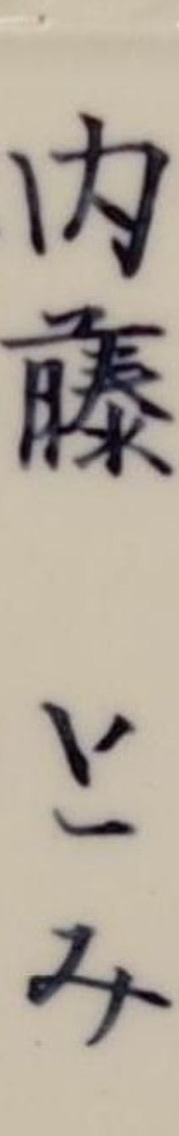内藤とみ
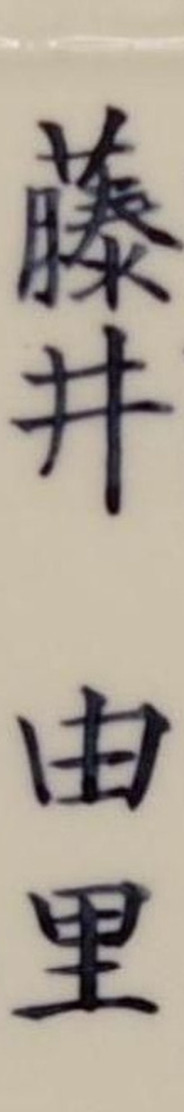藤井由里
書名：M~S
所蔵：高野山金剛峯寺
